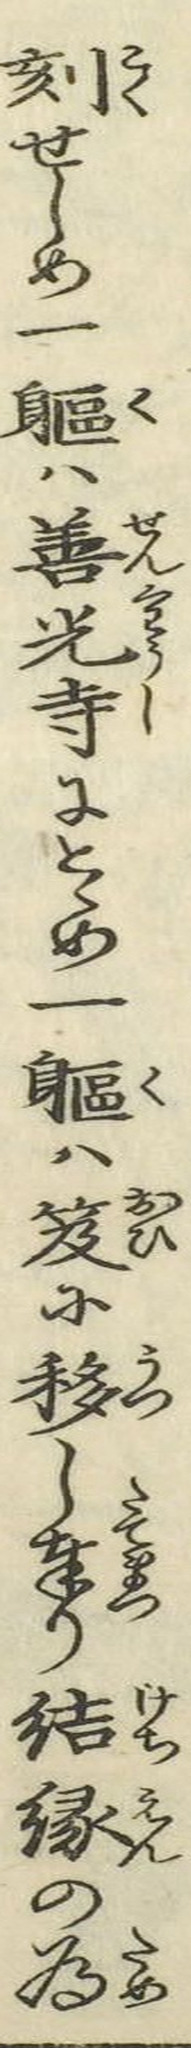刻せしめ一軀は善光寺にとゝめ一軀は笈に移し奉り結縁の為
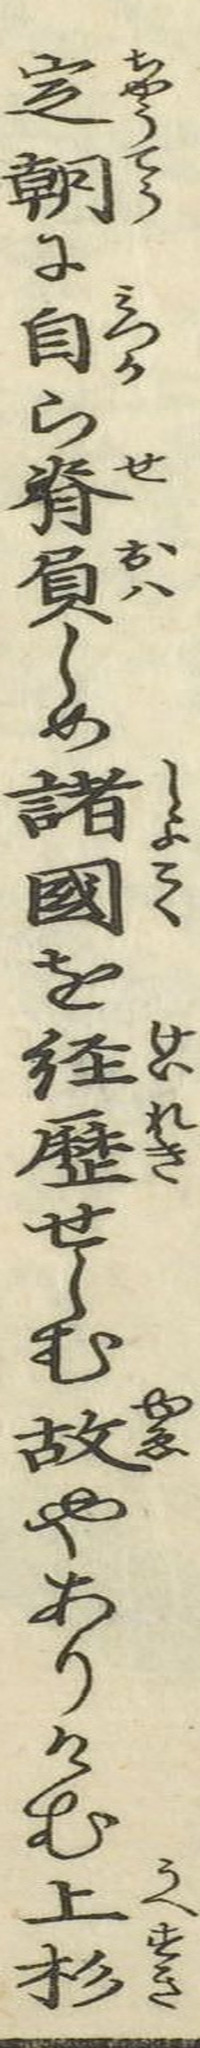定朝に自ら脊負しめ諸國を経歴せしむ故やありけむ上杉
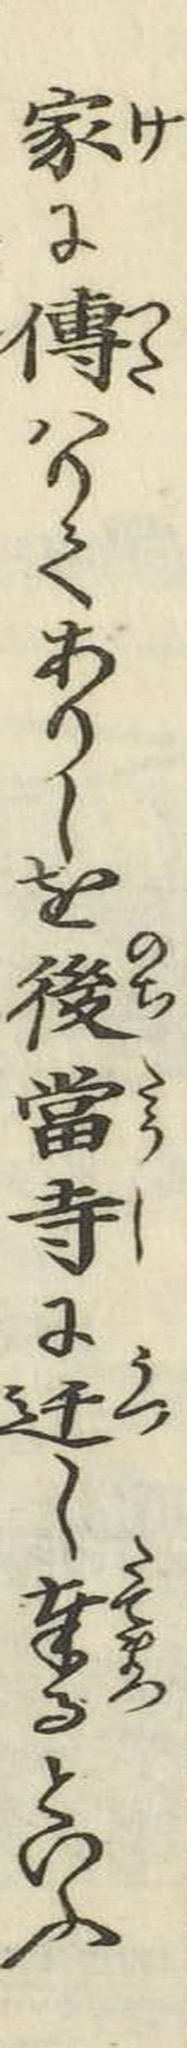家に傳はりてありしを後當寺に迁し奉るといふ
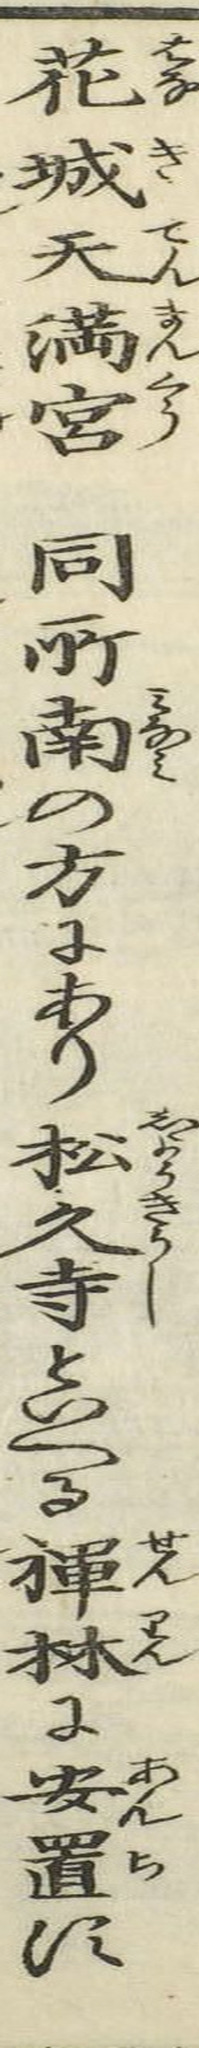花城天満宮同所南の方にあり松久寺といへる禪林に安置す
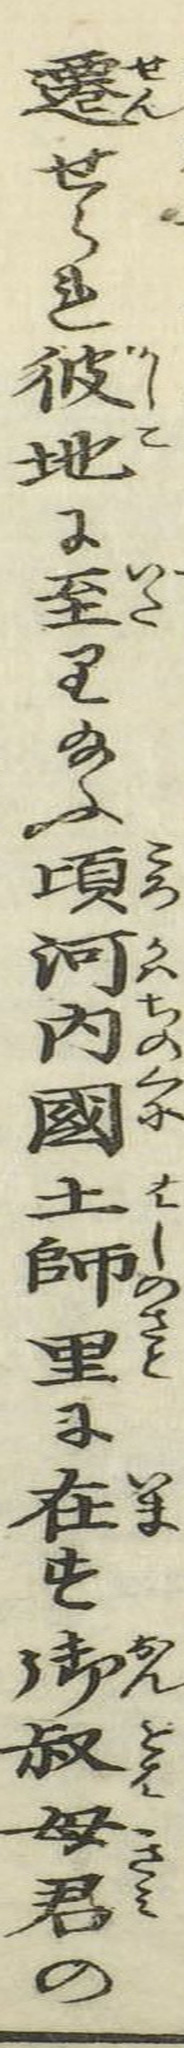遷せられ彼地に至り給ふ頃河内國土師里に在す御叔母君の
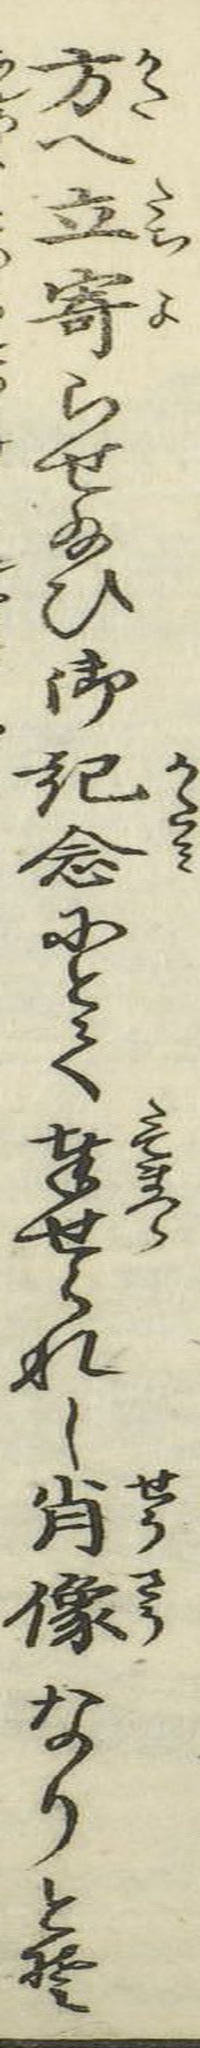方へ立寄らせ給ひ御記念にとて奉せられし肖像なりとそ
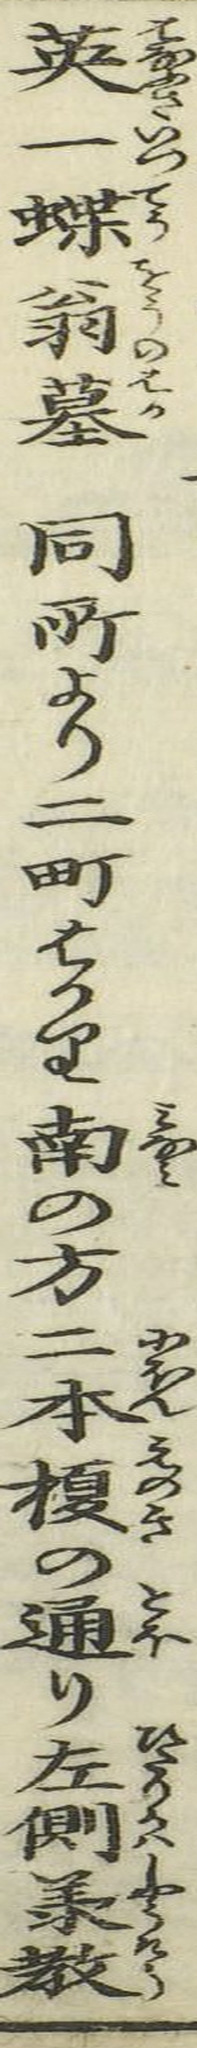英一蝶翁墓同所より二町はかり南の方二本榎の通り左側承教
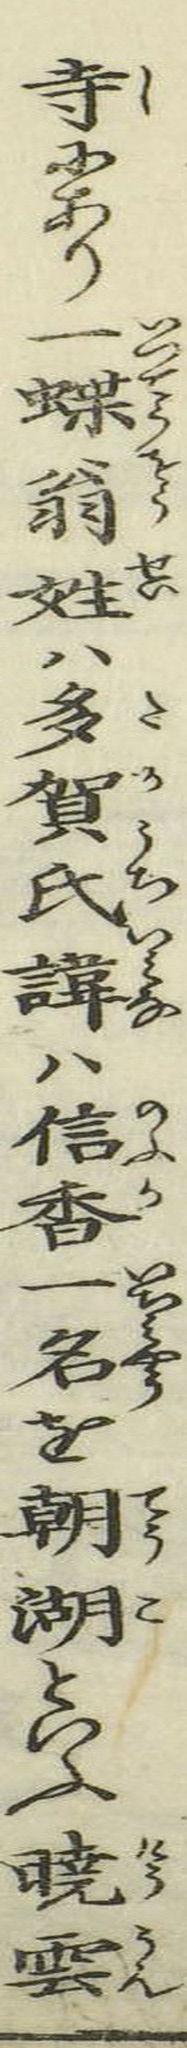寺にあり一蝶翁姓は多賀氏諱は信香一名を朝湖といふ暁雲
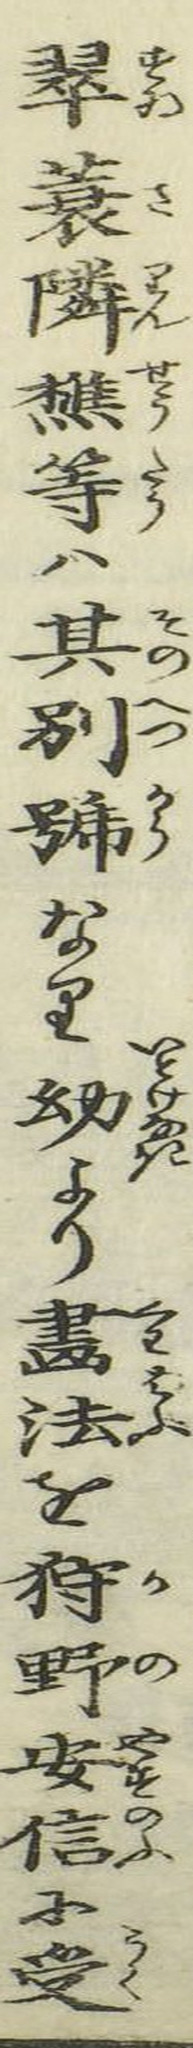翠蓑隣樵等は其別號なり幼より畵法を狩野安信に受
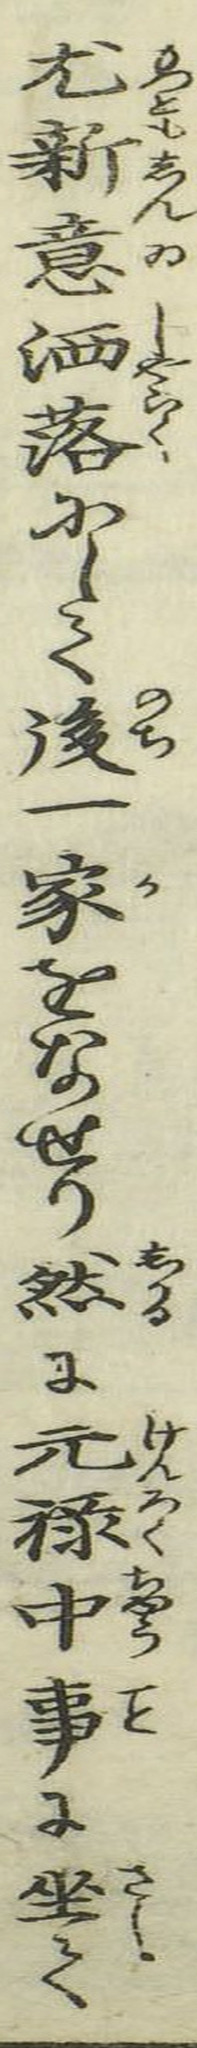尤新意洒落にして後一家をなせり然に元禄中事に坐て
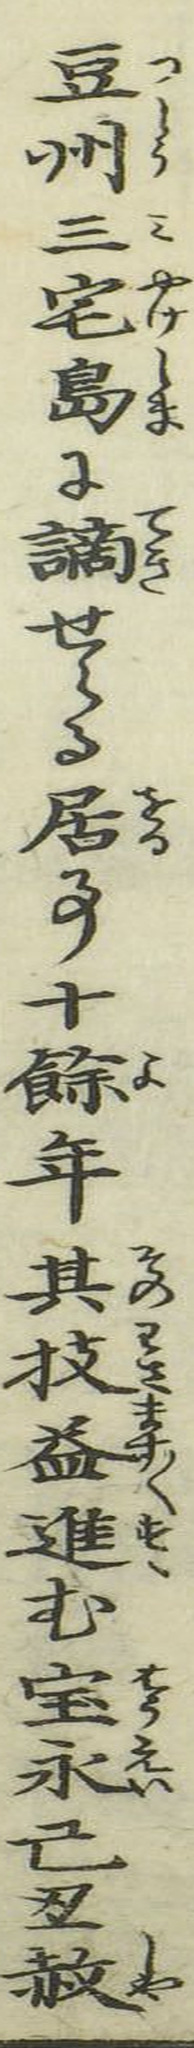豆州三宅島に謫せらる居事十餘年其技益進む宝永己丑赦

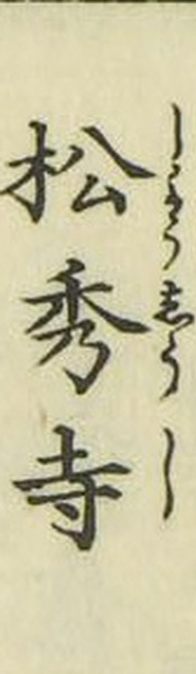松秀寺

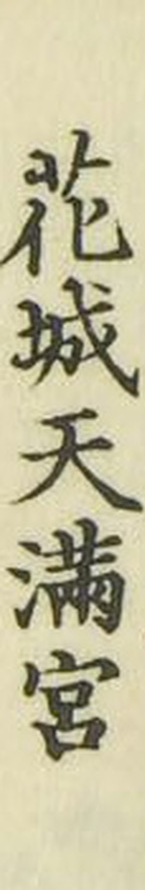花城天満宮
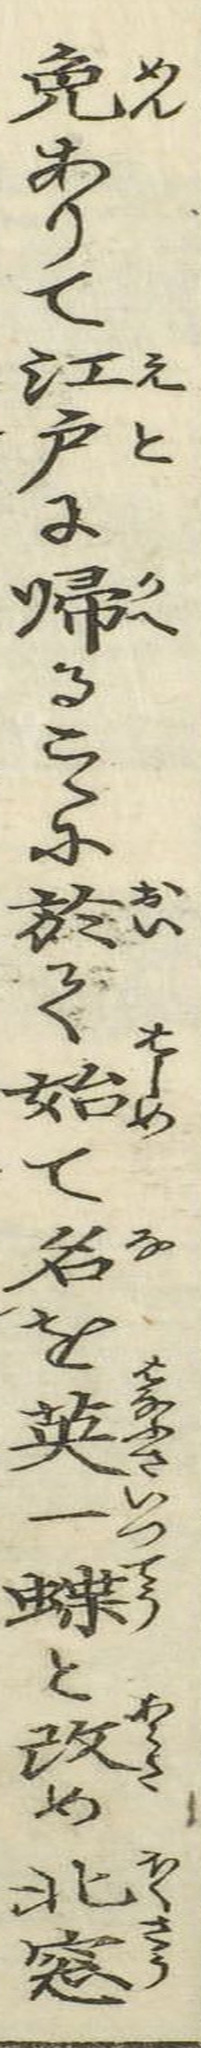免ありて江戸に帰るこゝに於て始て名を英一蝶と改め北窓
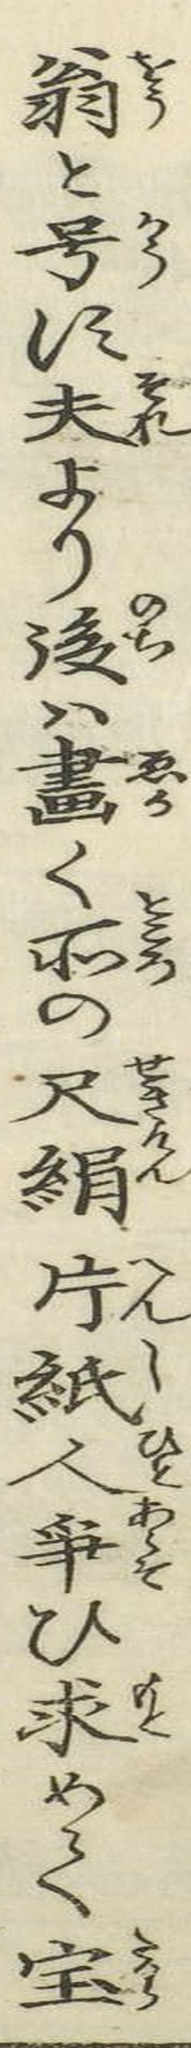翁と号す夫より後は畵く所の尺絹片紙人爭ひ求めて宝
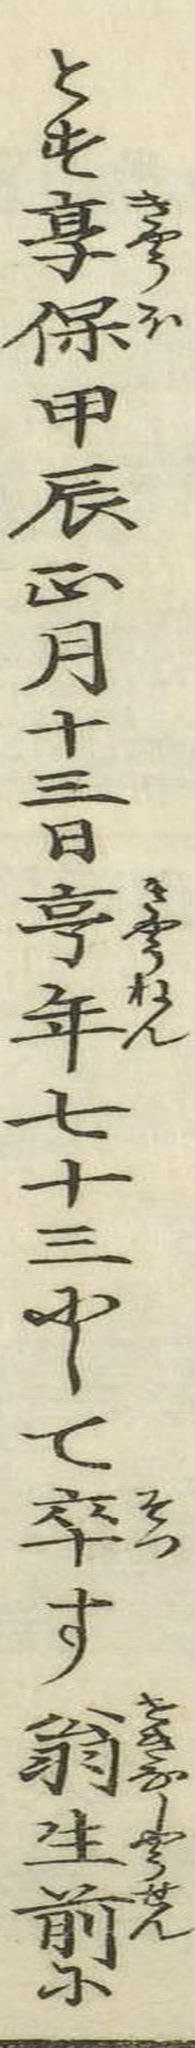とす享保甲辰正月十三日享年七十三にして卒す翁生前に
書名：江戸名所図会 20巻 巻之7
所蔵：東京学芸大学教育コンテンツアーカイブ
